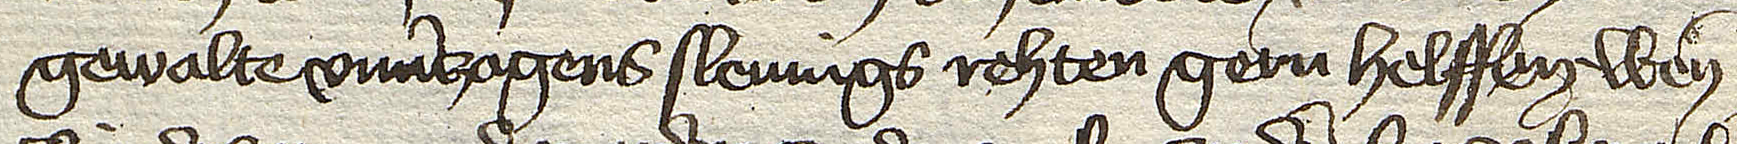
gewalte vnu*cʒogens ſleunigs rehten gern helffen . wen*
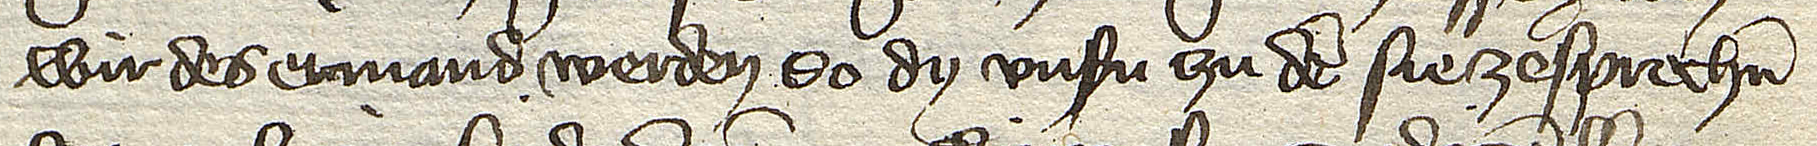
wir des ermand werden So dy vnſ*n cʒu de* ſie cʒeſprechn*
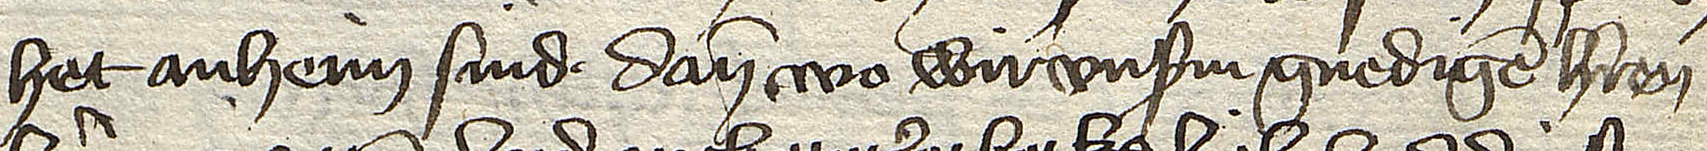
het anheim ſind . dan* wo wir vnſ*m gnedige* h*ren
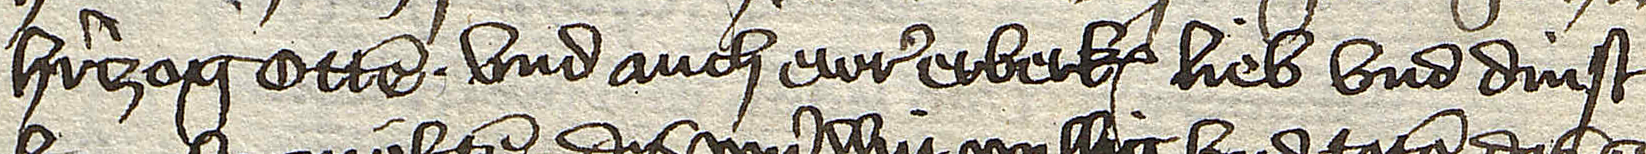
hr*cʒog Otte* . vnd auch ewr* erberk* lieb vnd dinſt
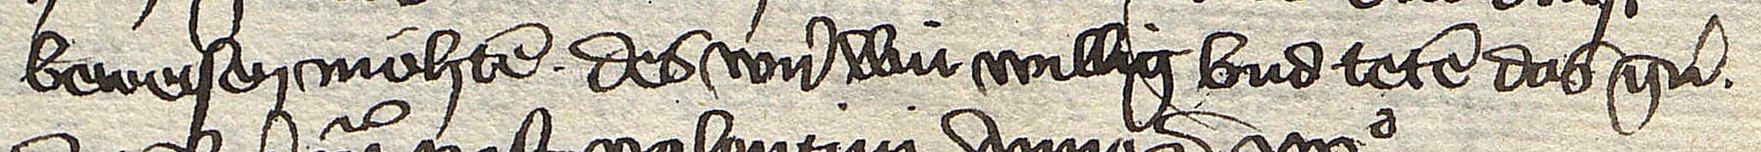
beweiſen möhte* . Des wn* wir willig vnd tete* das gn* .
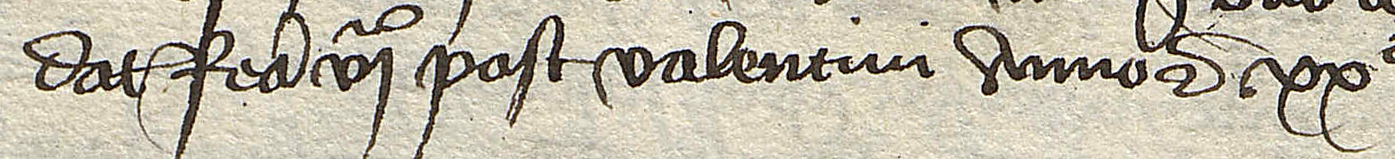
Dat* fea* vi* poſt valentini Anno ec* xx*
